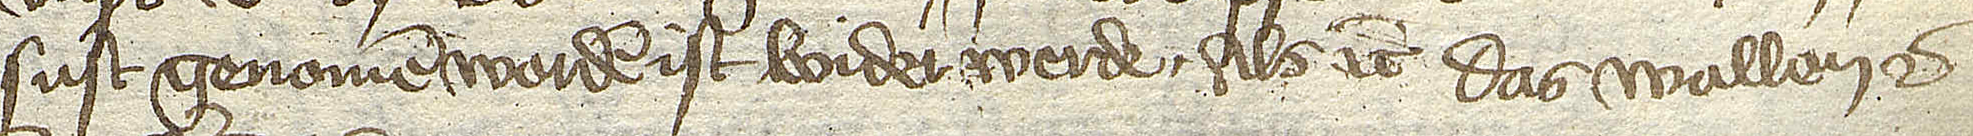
ſuſt genome* word* iſt wider werde / Als ec* Das wollen ec*
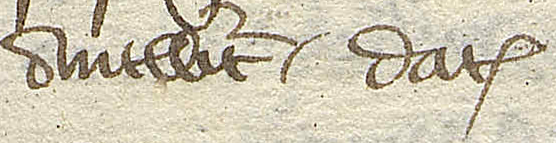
Antw*t / Dat*
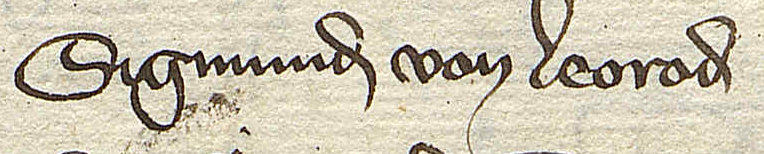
Sigmund* von Leorod
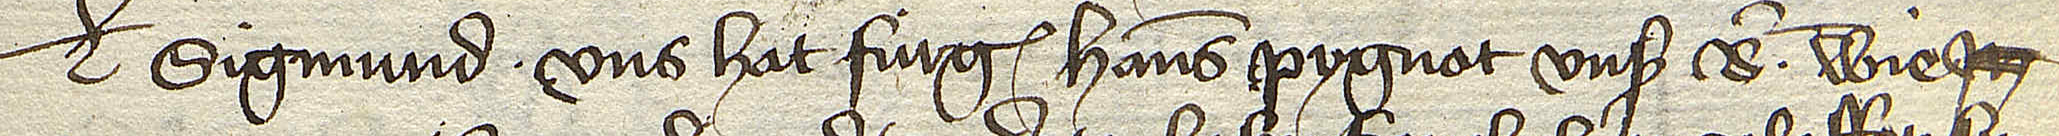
L* Sigmund . vns hat fürg* han*s pygnot vnſ* B* . wie In
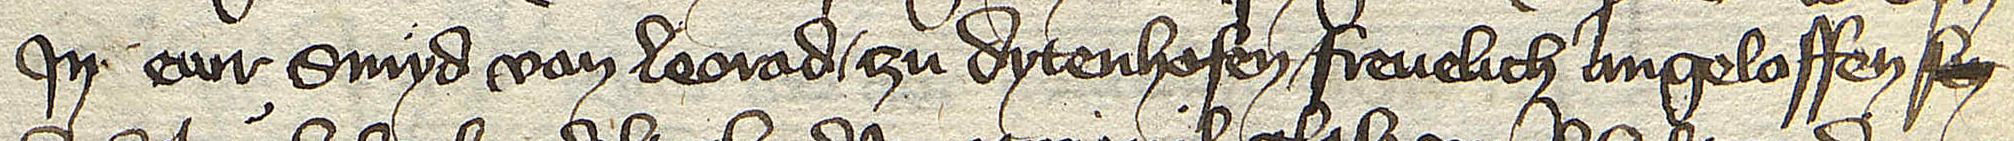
In ewr Smyd von leorod / cʒu Dytenhofen / freuelich angeloffen ſey
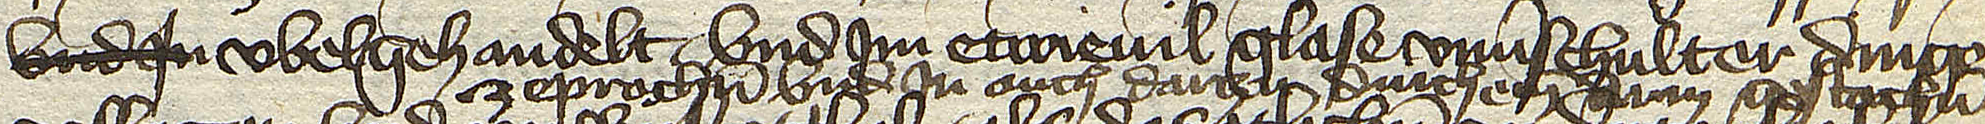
vnd In v̈belgehandelt / vnd Im etwieuil glaſe vnu*ſchulter dinge
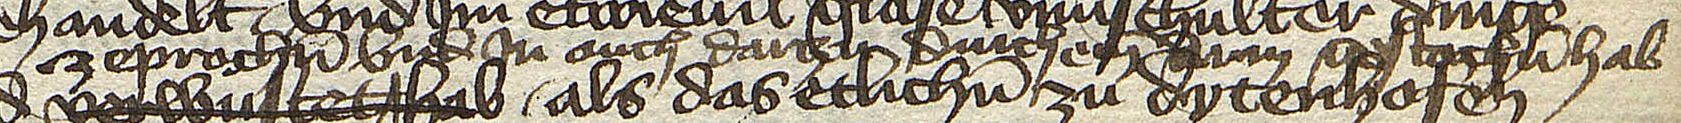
cʒprochn* vnd In auch darcʒu durch ein* Arm geſtochn* hab
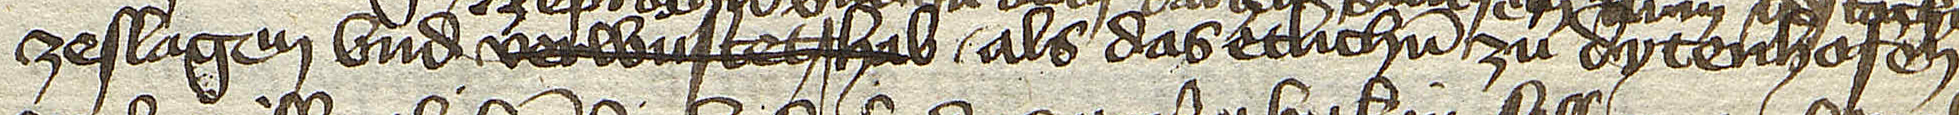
cʒeſlagen vnd verwuſtet hab / als das etlichn* cʒu Dytenhofen
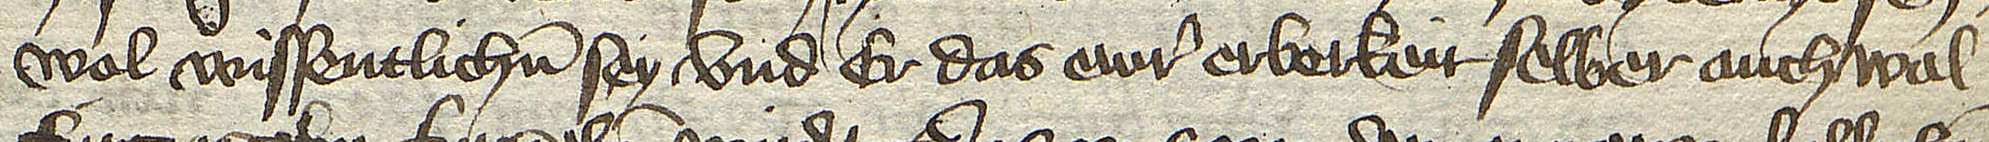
wol wiſſentlichn* ſey / vnd Er das ewr* erberkeit ſelber auch wol
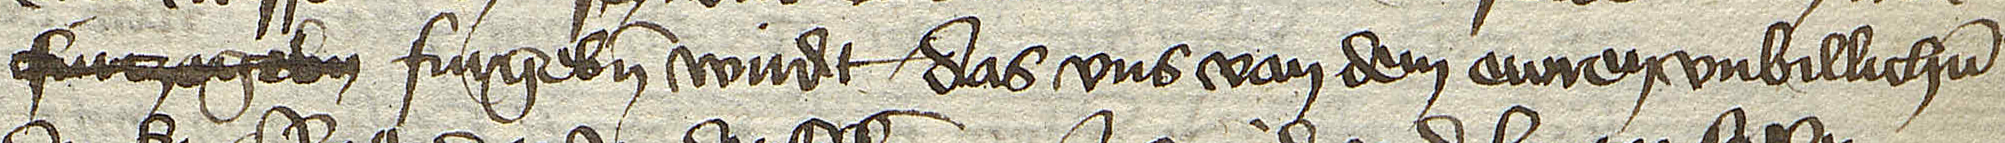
fürcʒegebn fürgebn* wirdt / Das vns von dem ewren vnbillichn*
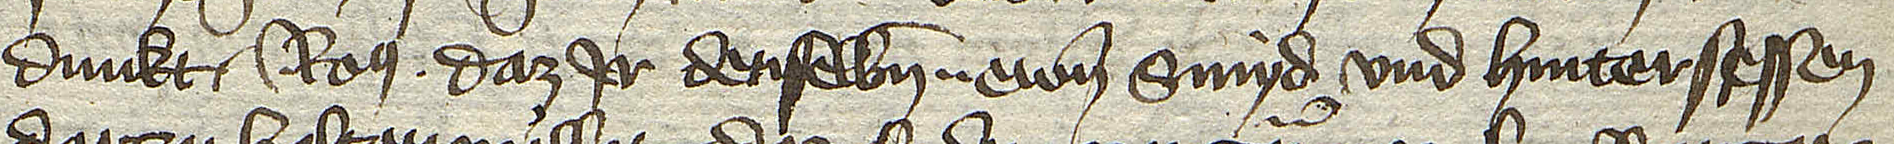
dunkt / Ro* . daʒ Ir denſelbn* ~ ewn* Smyd vnd hinterſeſſen
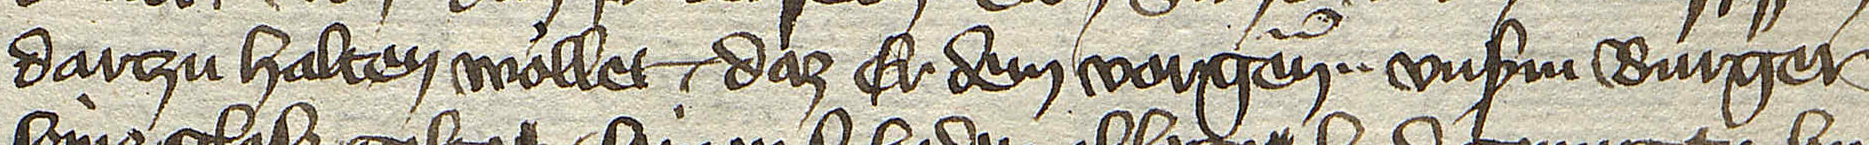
darcʒu halten wöllet / daʒ Er dem vorgen* ~ vnſ*m Burger
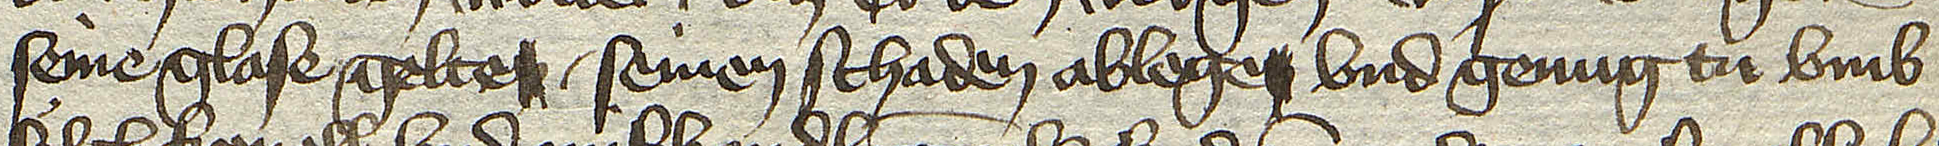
ſeine glaſe gelten / ſeinen ſchaden ablegen vnd genug tu vmb
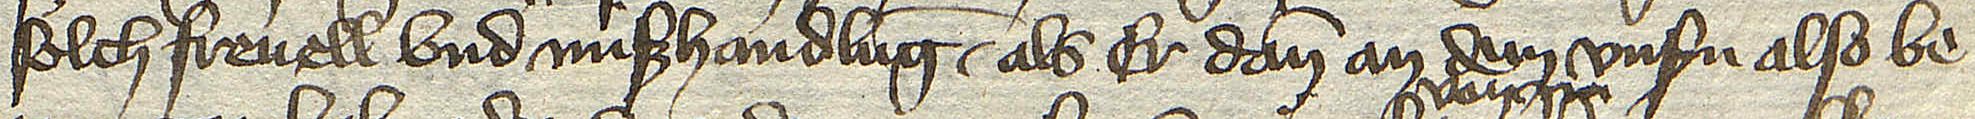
ſölch freuell vnd miſʒhandlu*g / als Er dan* an dem vnſ*n alſo be
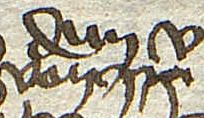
von Im
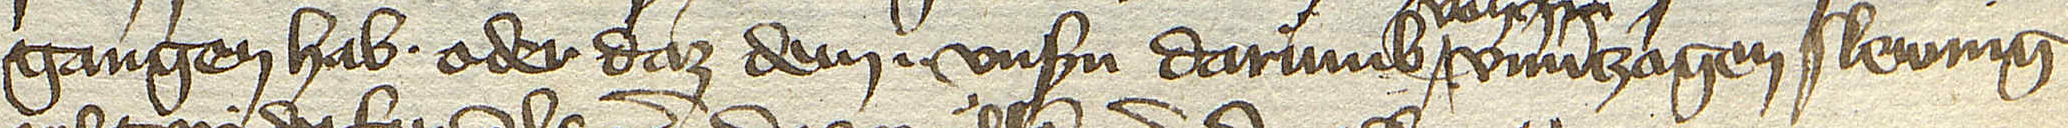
gangen hab . oder daʒ dem ~ vnſ*n darümb vnu*cʒogen ſlewnig
